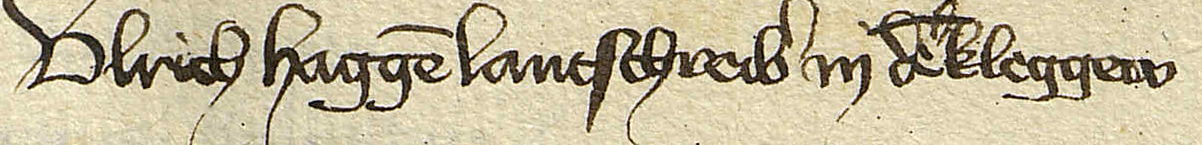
Vlrich hagge* lantſchreib* in de* kleggew
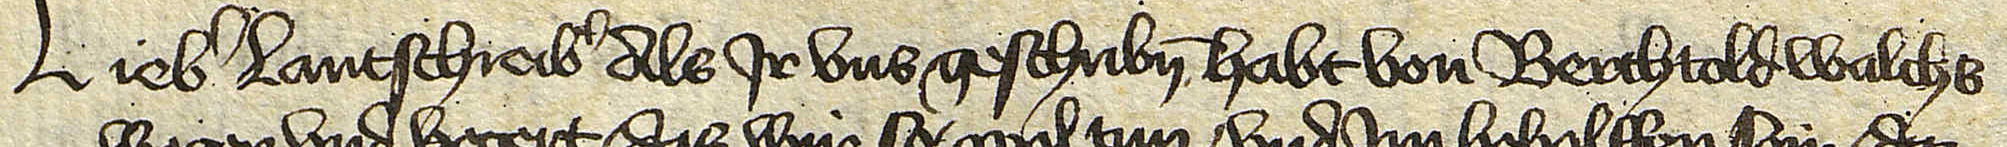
Lieb* Lantſchrieb* Als Ir vns geſchribn* habt von Berthold Walchs
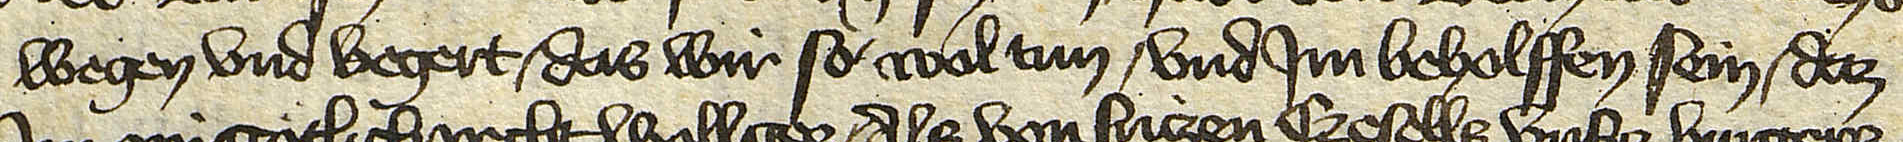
wegen vnd begert / das wir ſo / wol tun / vnd Im beholffen ſein / daʒ
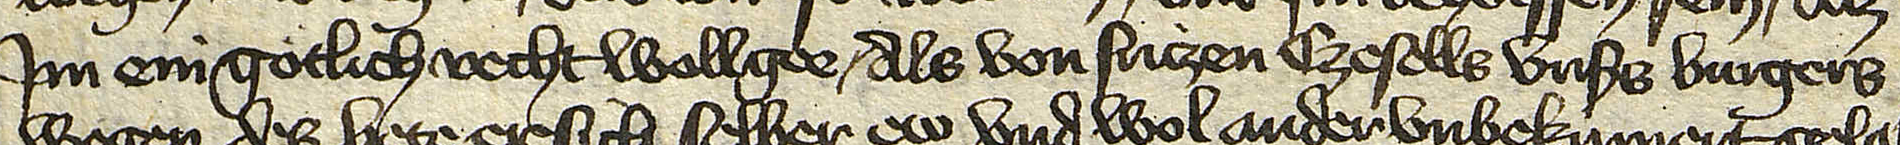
Im ein götlich recht wollgee / Als von fricʒen Cʒells vnſ*s burgers
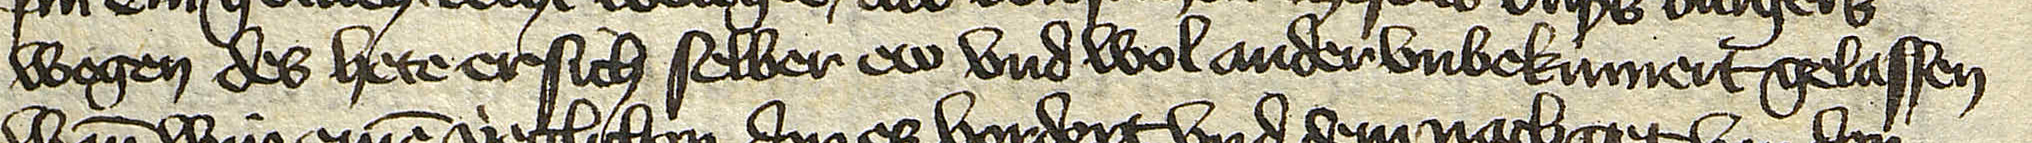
wegen des hete er ſich ſelber ew vnd wol ander vnbekumert gelaſſen
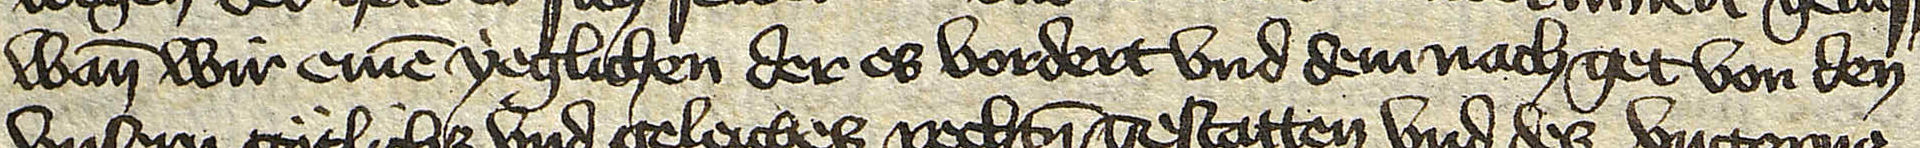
wan* wir eine* yeglichen der es vordert vnd dem nach get von den
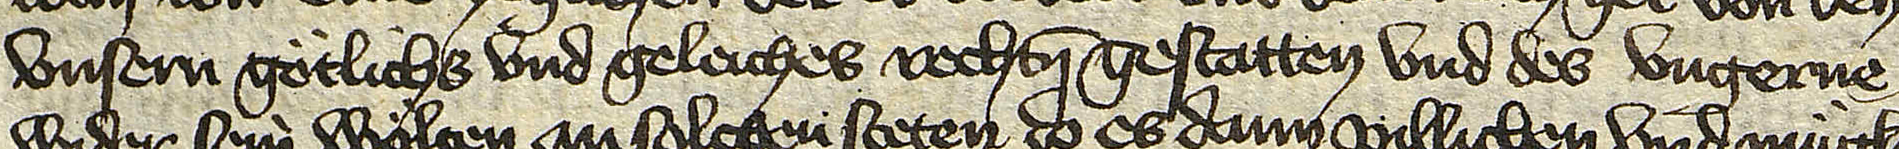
vnſern götlichs vnd geleiches rechtn* geſtatten vnd des vngerne
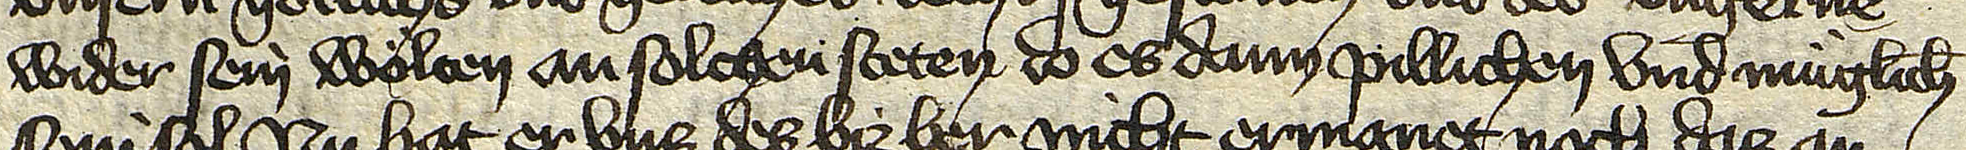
wider ſein wölten an ſolchen ſteten do es dann pillichen vnd müglich
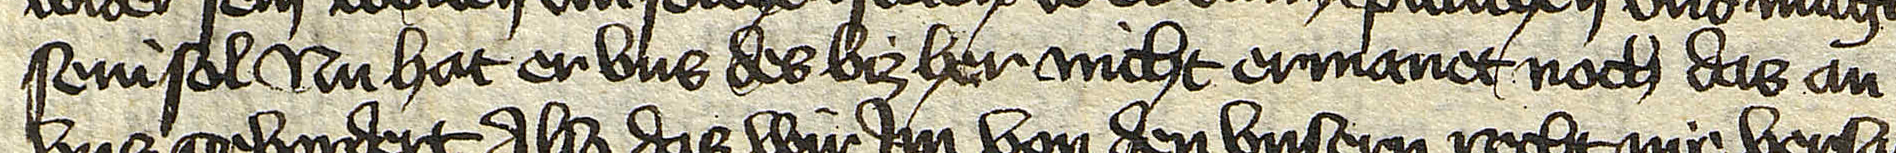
ſein ſol Nu hat er vns des biʒ her nicht ermanet noch das an
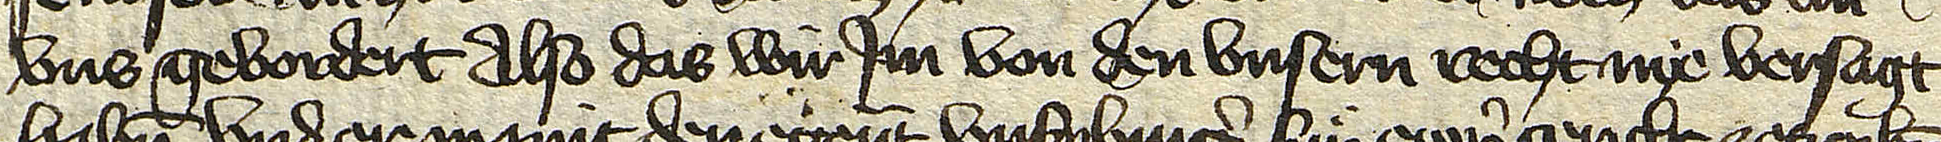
vns gevordert Alſo das wir Im von den vnſern recht nye verſagt
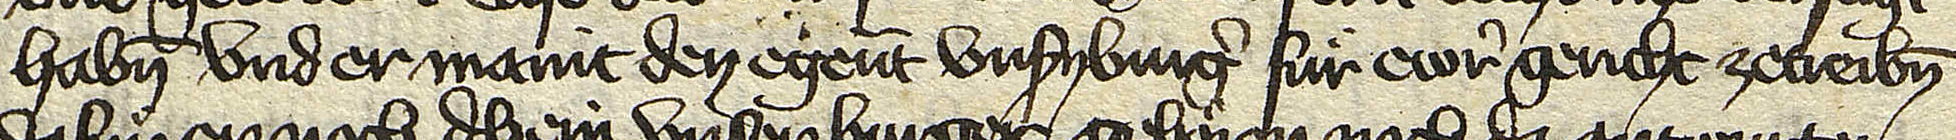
habn* vnd er maint den egent* vnſ*n burg* für ewr* gericht ʒetreibn*
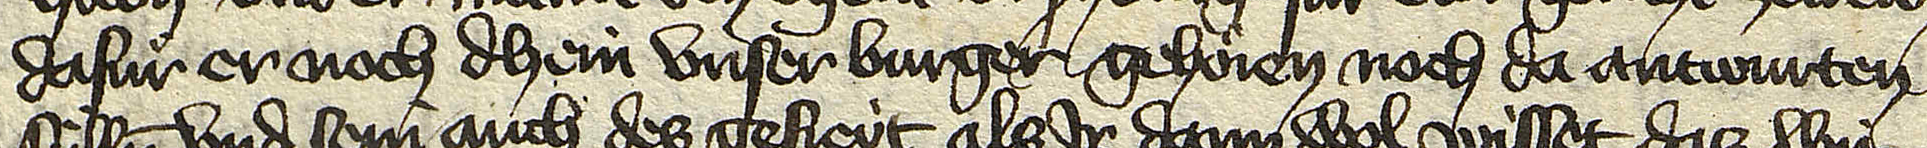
dafür er noch dhein vnſer burger gehören noch da antwurten
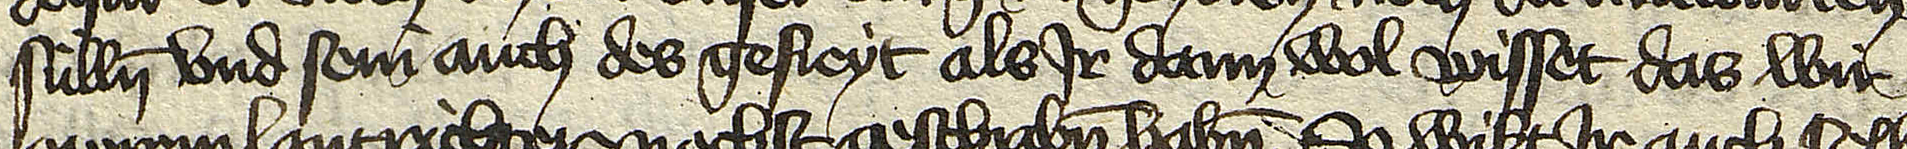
ſülln* vnd ſein auch des gefreyt als Ir dann wol wiſſet das wir
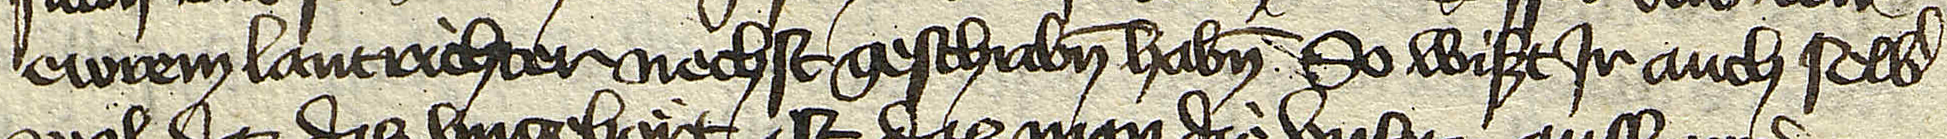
ewrem lantrichter nechſt geſchribn* habn* So wiſʒt Ir auch ſelb*
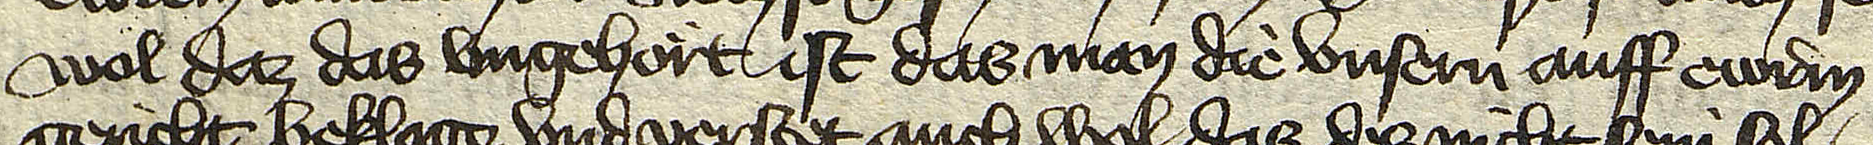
wol daʒ das vngehört iſt das man die vnſern auff ewr*m
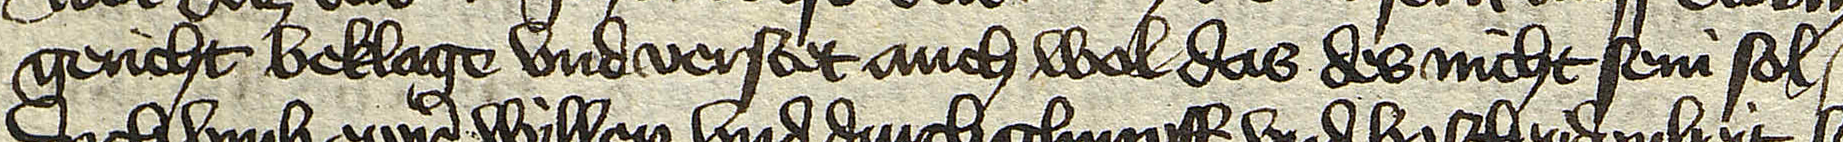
gericht beklage vnd verſtet auch wol das des nicht ſein ſol /
